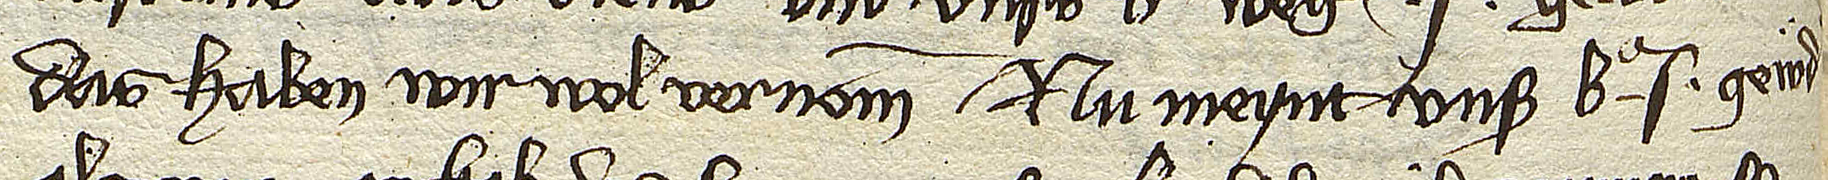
das haben wir wol vernom* / Nu meynt vn* b* . ſ . geẅd*
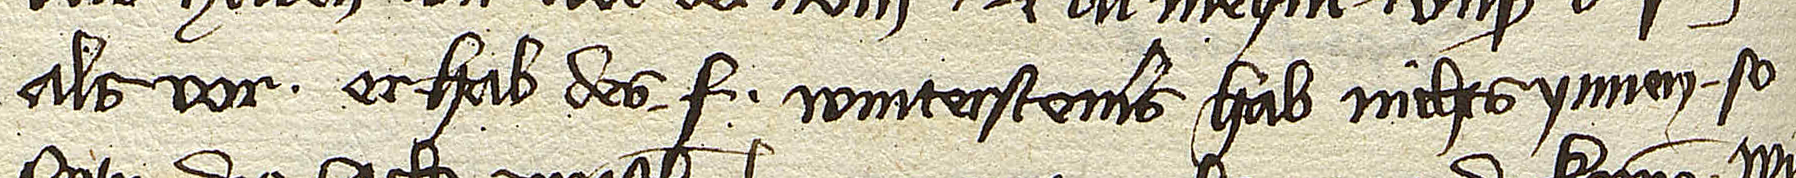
als vor . er hab des f . winterſtein*s hab nichts ynnen . ſo
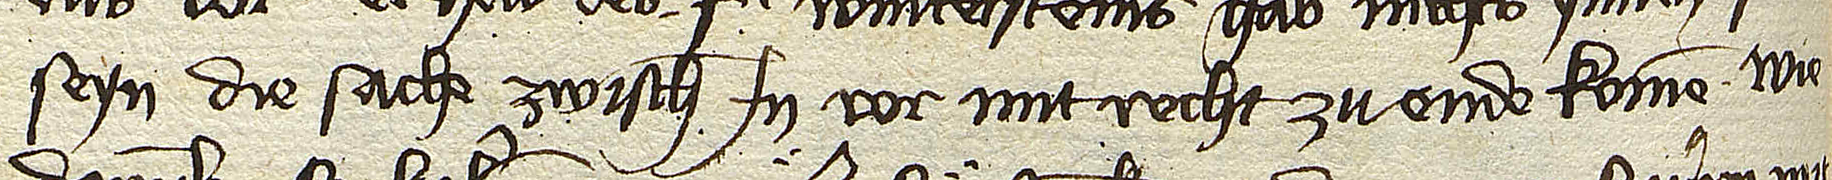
ſeyn die ſache ʒwiſch* In vor mit recht ʒu ende kome* . wie
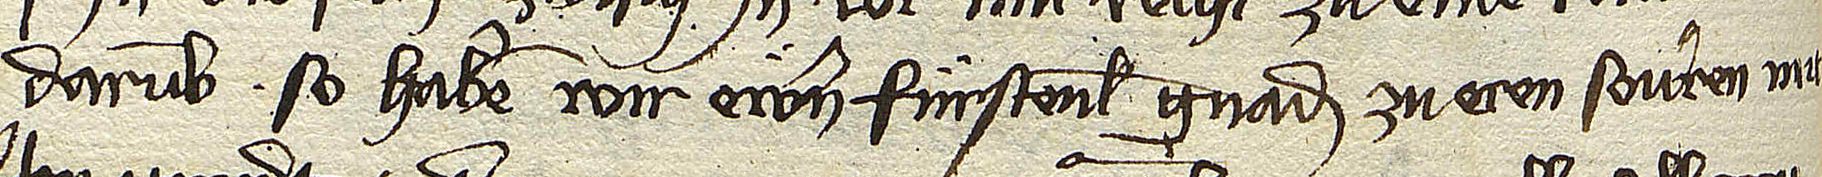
darub* . ſo habe* wir eẅ*n fürſtenl* gnad* ʒu eren ſou*ren mit
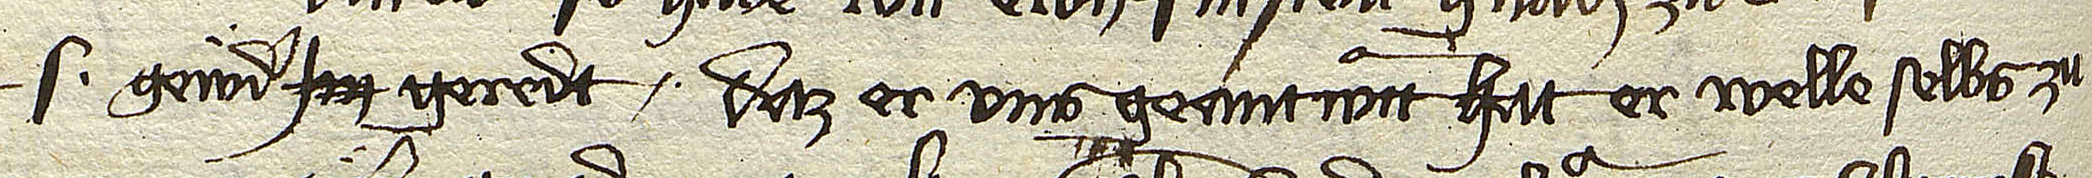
. ſ . geẅd Im geredt / daʒ er vns geantw*tt hat er welle ſelbs ʒu
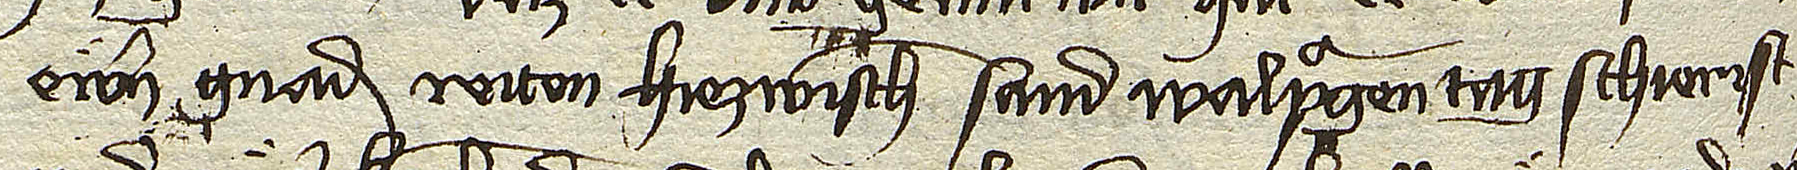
eẅ*n gnad* reiten hieʒwiſch* ſand walp*gen tag ſchieriſt
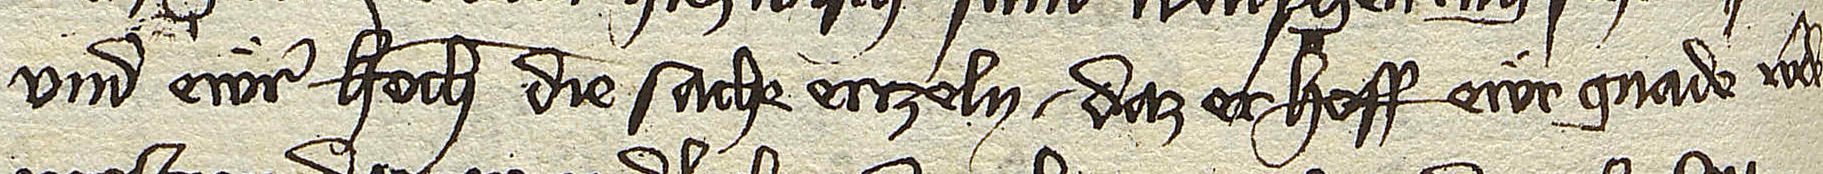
vnd eẅr* hoch* die ſache ercʒeln / daʒ er hoff eẅr gnade w*d
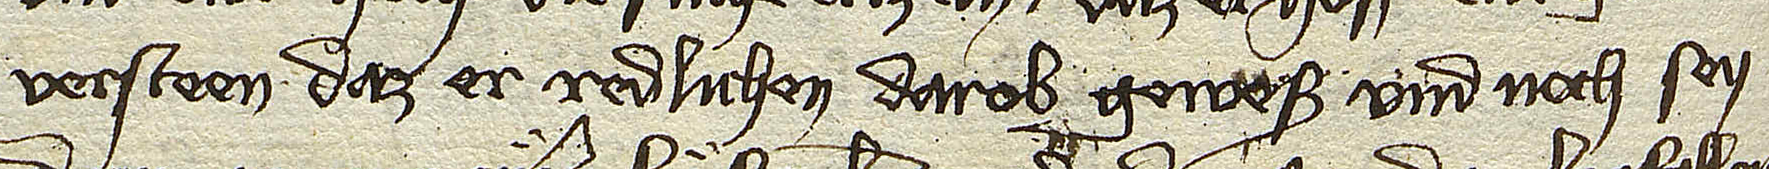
verſteen . daʒ er redlichen darob geweſ* vnd noch ſey
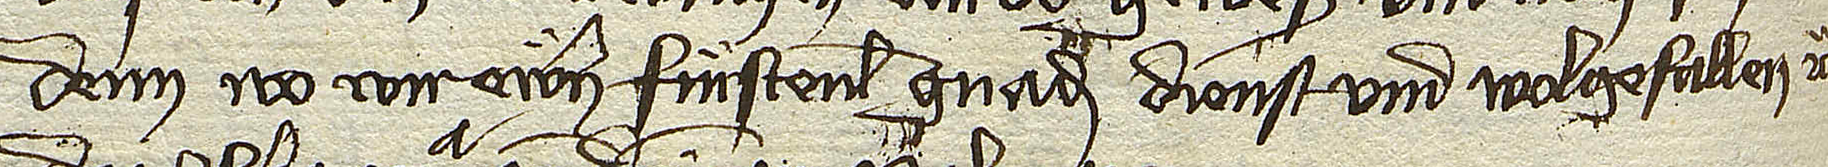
Denn wo wir eẅ*n fürſtenl* gnad* dienſt vnd wolgefallen ec*
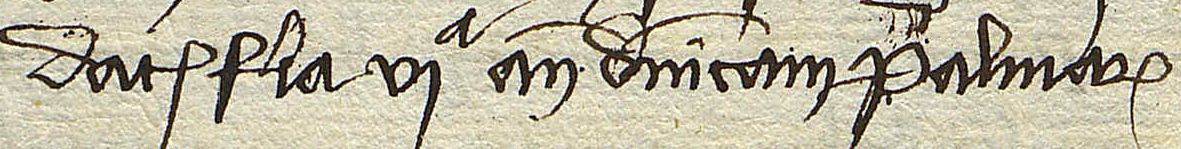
Dat* f*ia vi* an* dnicam* Palma*
